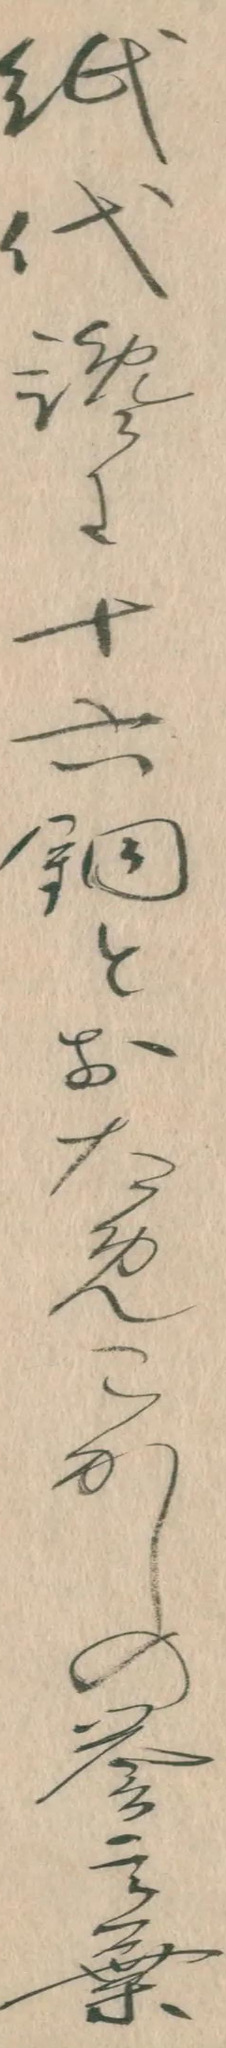紙代纔に十六銅とおためこかしの誉言葉
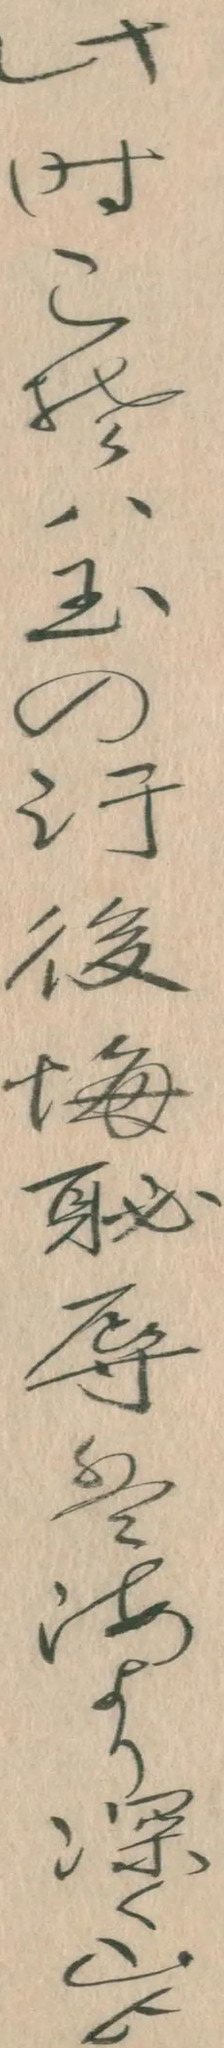此時こそは玉の汗後悔恥辱は海より深く山ゟ
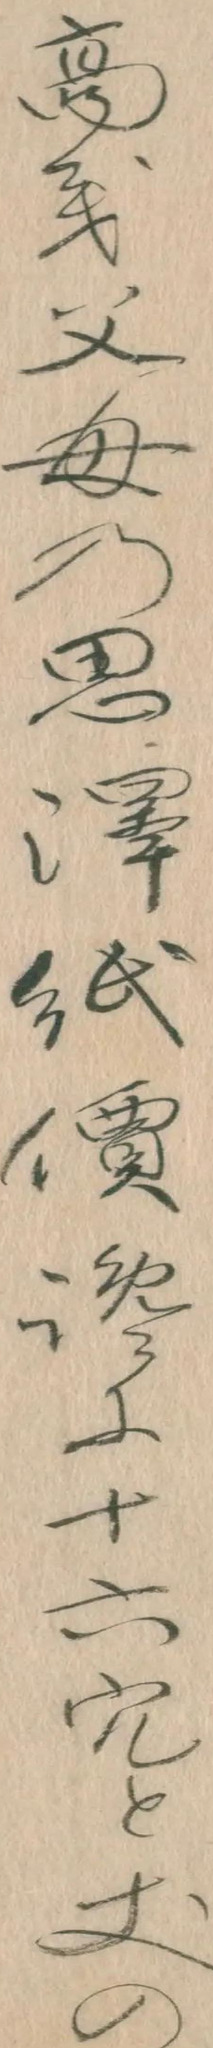高き父母の恩沢紙価纔に十六穴と丈の
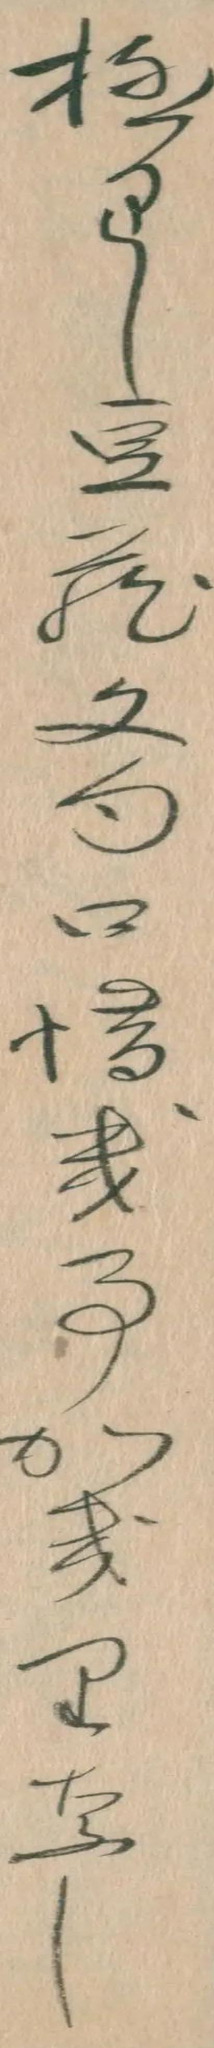極りし豆蔵文句口惜き事かきりなし
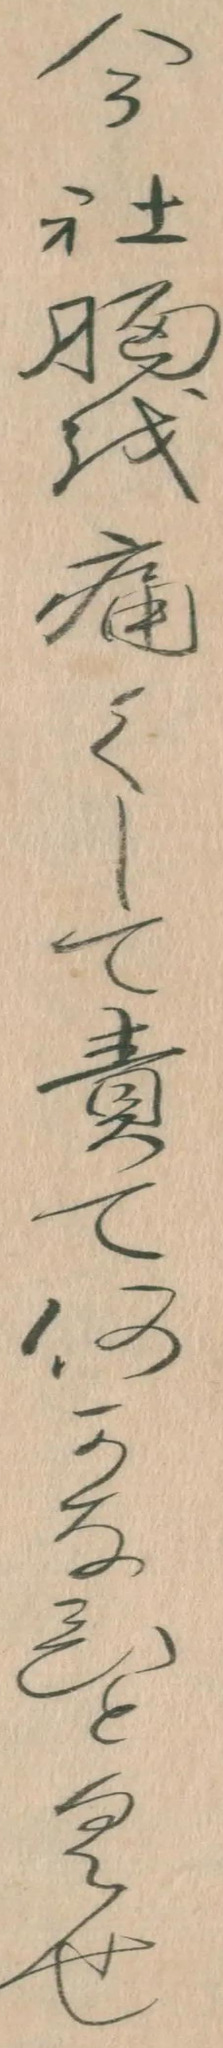今社胸を痛くして責て何かなひとくせ
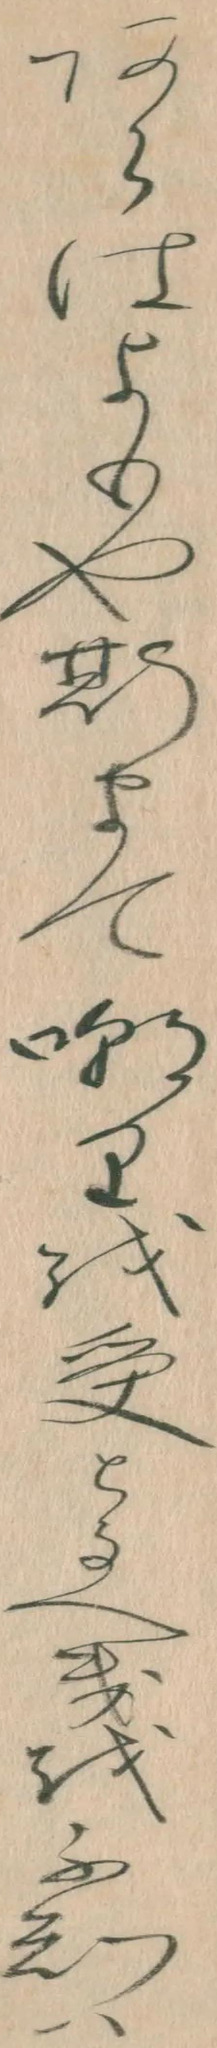あらはよもや斯まて嘲りを受けとるへきを不知は
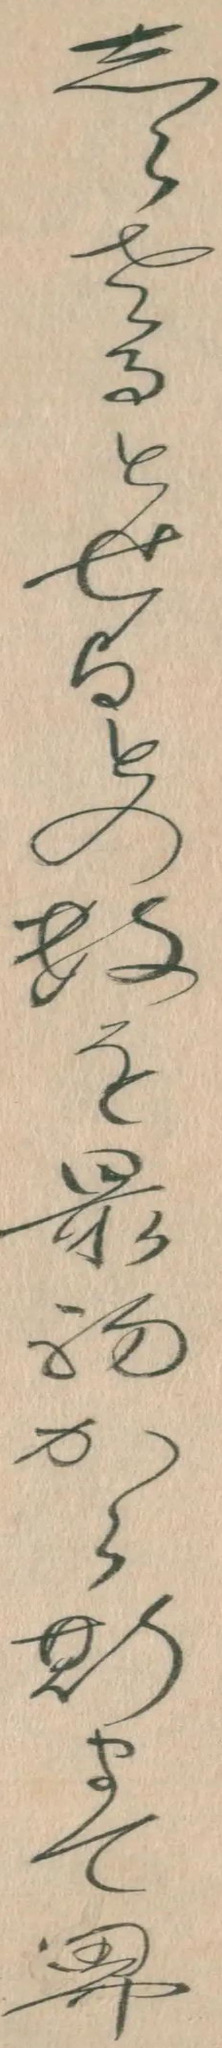しらさるとせよとの教を最初から斯まて卑
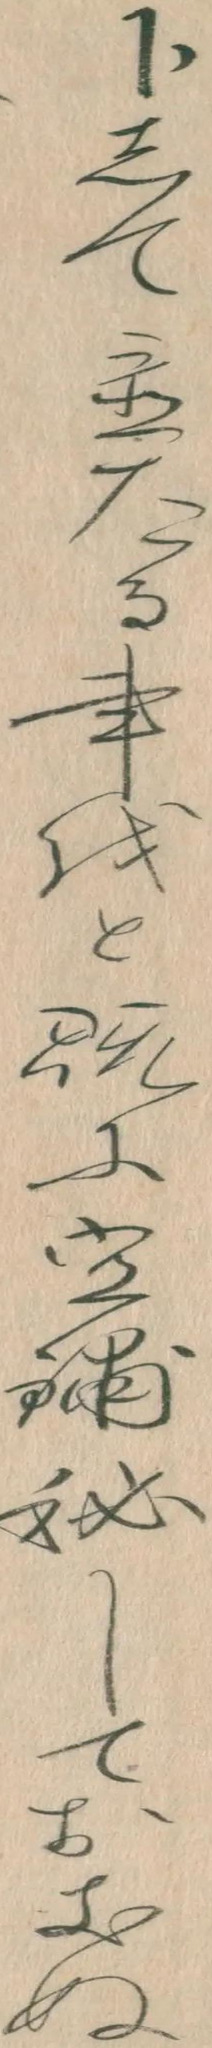下して置たる事をと既に空鋪秘しておきぬ
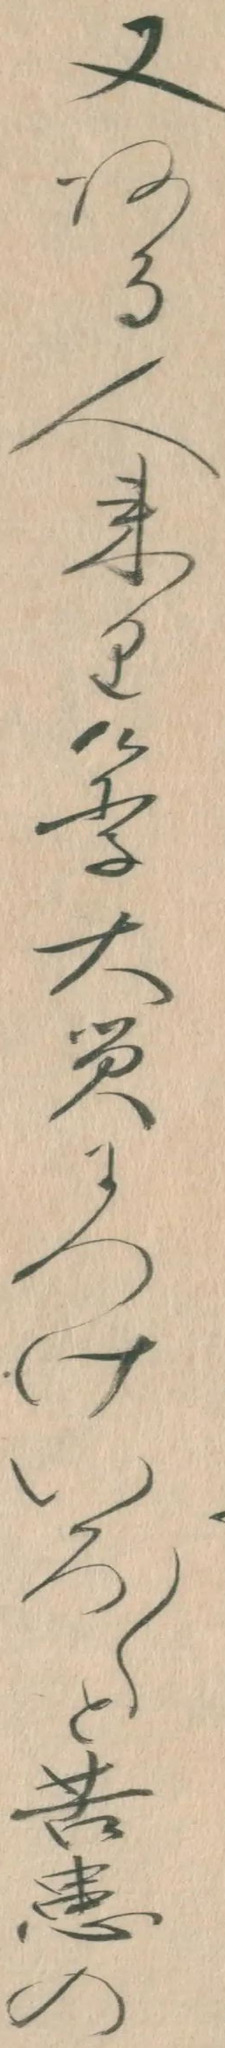又ある人来りけり大災につけいろ〳〵と苦患の
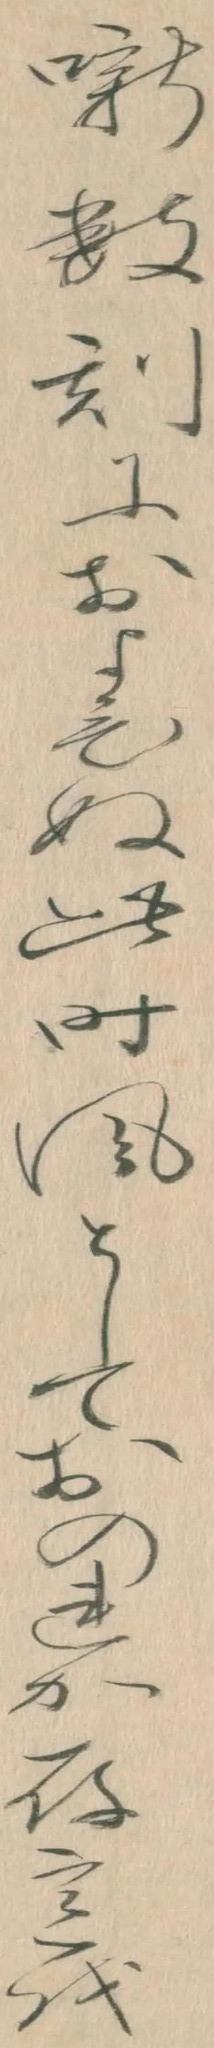噺数刻およひぬ此時風としておのれか存意を
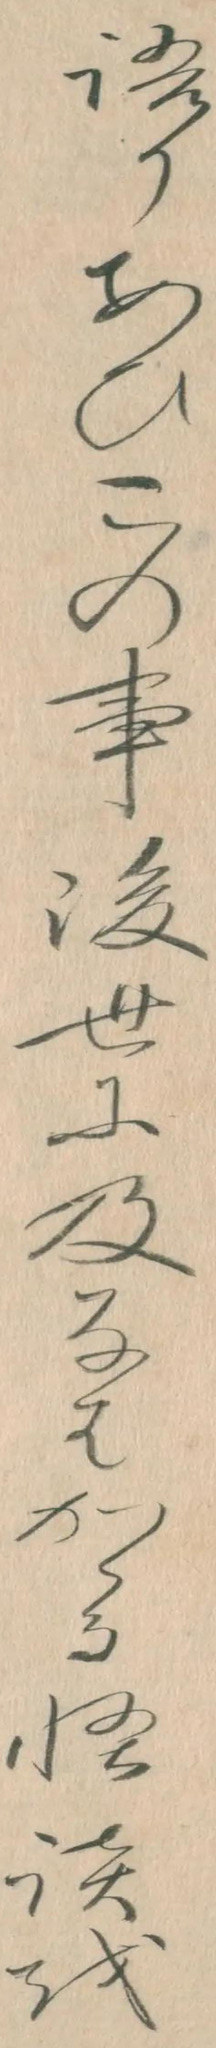語りあひこの事後世に及なはかゝる怪談を
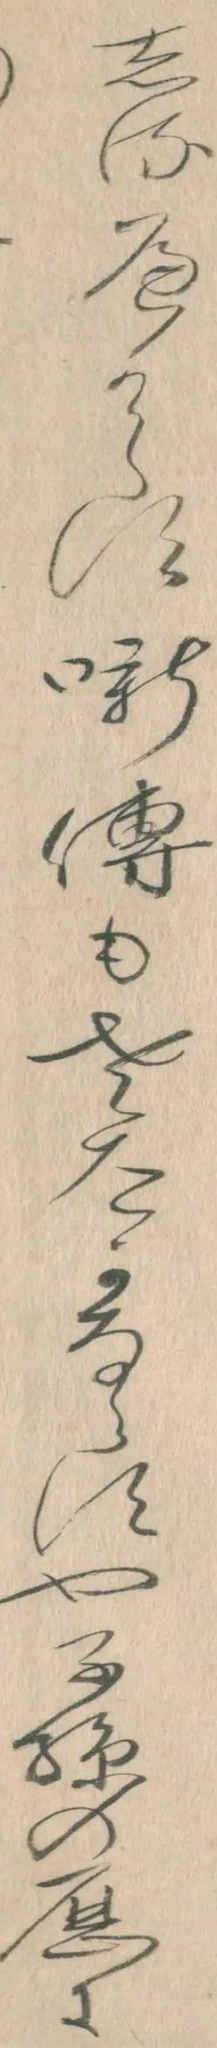しるへからす噺伝もさたかならすや子孫の慰に
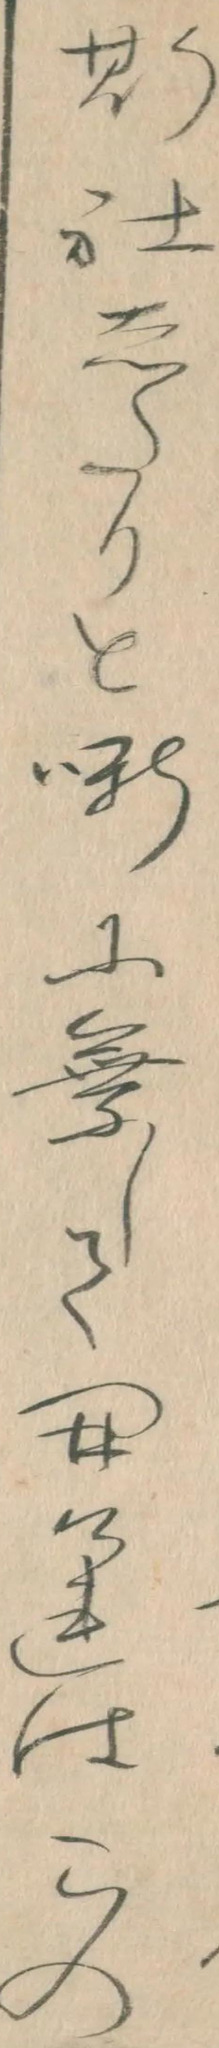斯社したりと噺に乗して開けれはこの

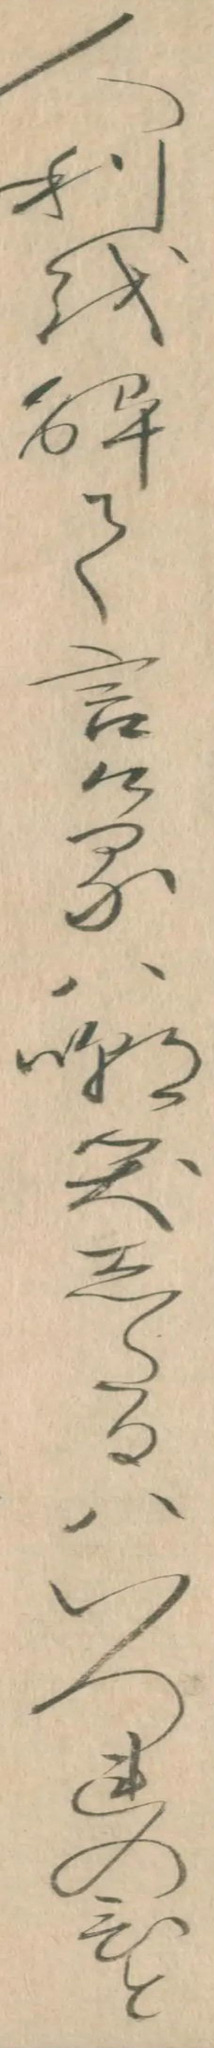人利を解て言けるは嘲笑したるはいつれのひと
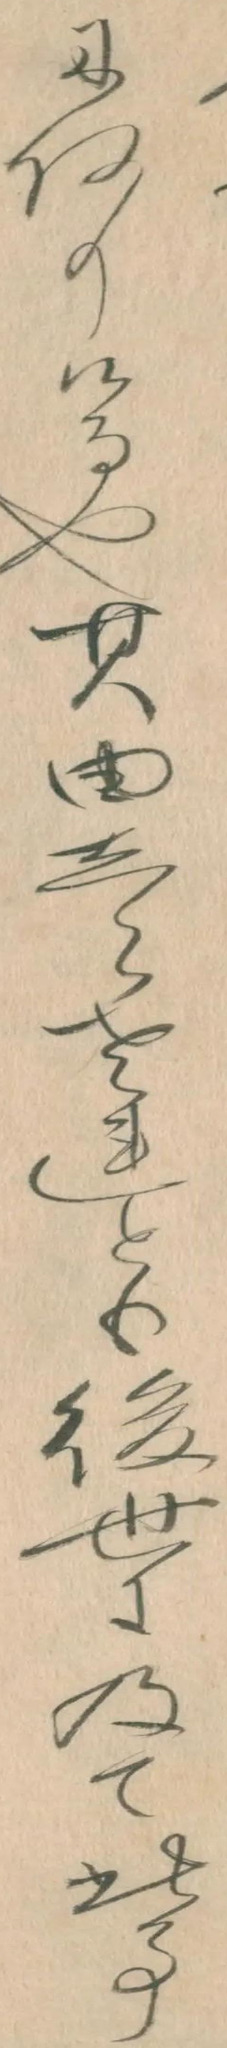にありけるや其由しらされとも後世に及て此事
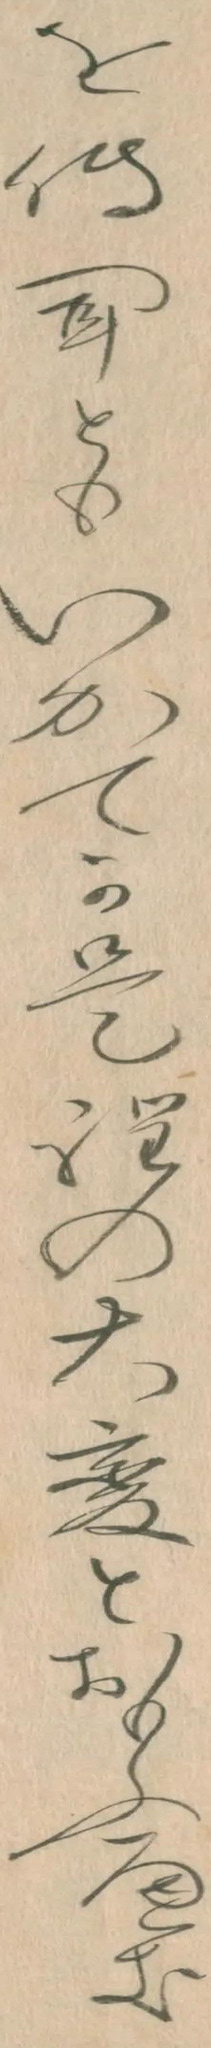を伝聞ともいかてか是程の大変とおもふへき
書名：俗語之種. [4]
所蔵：国立国会図書館 National Diet Library, JAPAN
